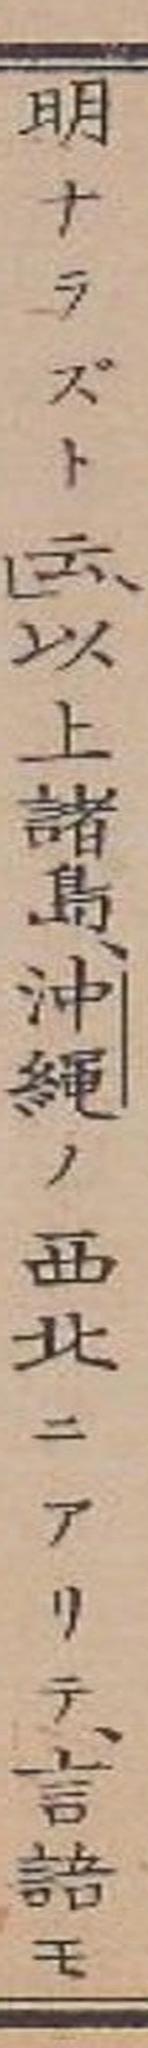明ナラズト云、」以上諸島、沖縄ノ西北ニアリテ、言語モ
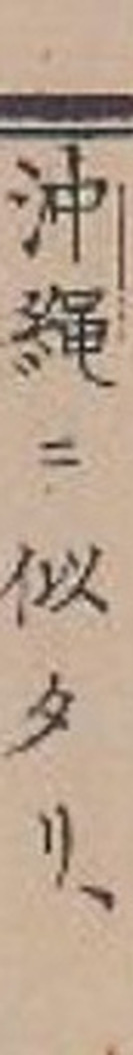沖縄ニ似タリ、
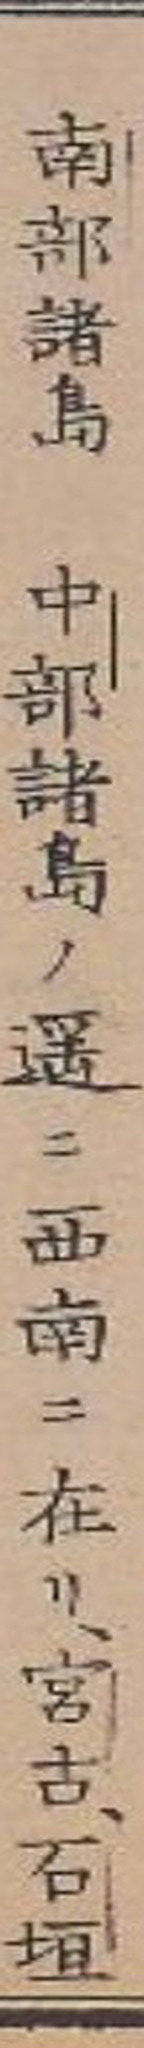南部諸島中部諸島ノ遥ニ西南ニ在リ、宮古、石垣
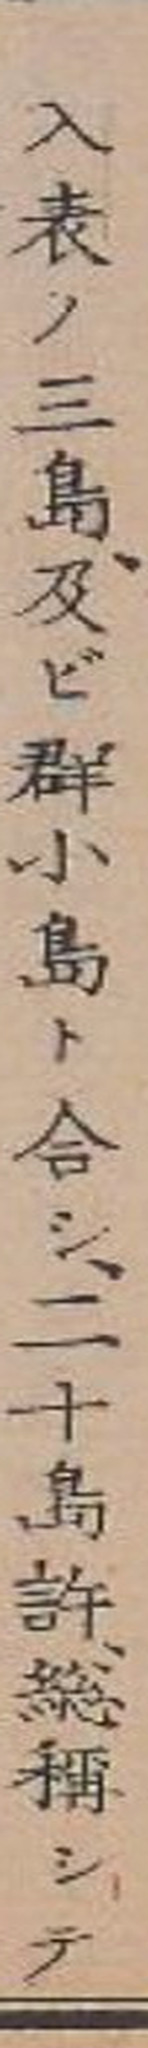入表ノ三島、及ビ群小島ト合シ、二十島許、総称シテ
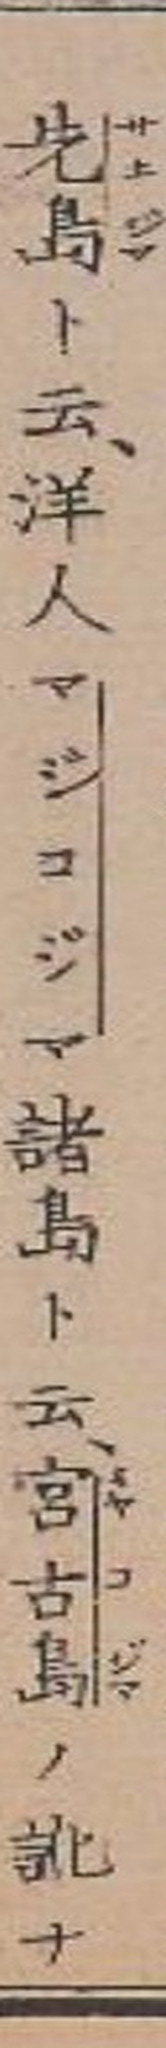先島ト云、洋人マジコジマ諸島ト云、宮古島ノ訛ナ
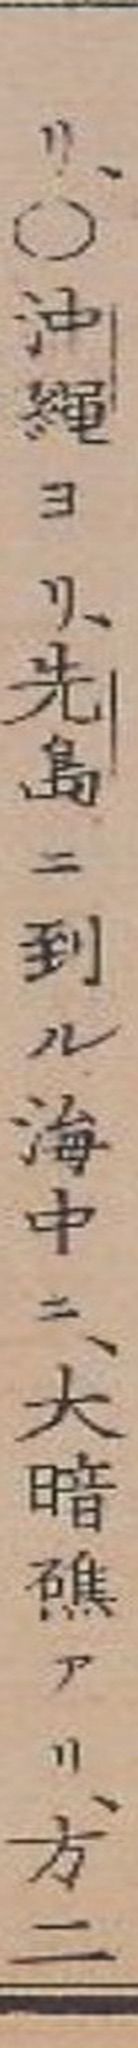リ、○沖縄ヨリ、先島ニ到ル海中ニ、大暗礁アリ、方二
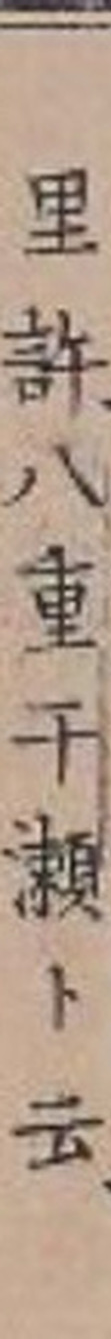里許、八重干瀬ト云、
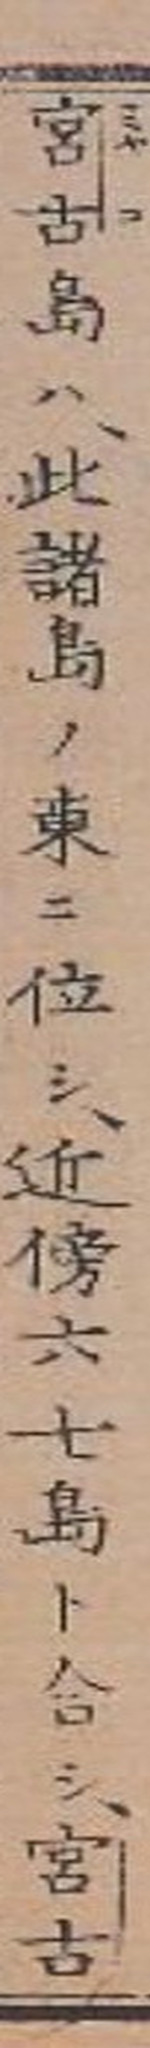宮古島ハ、此諸島ノ東ニ位シ、近傍六七島ト合シ、宮古

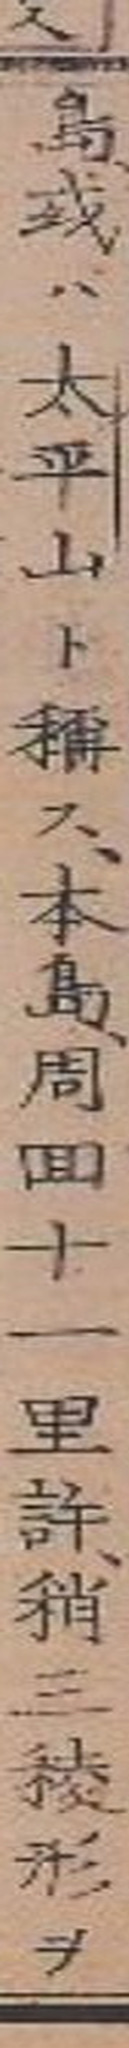島、或ハ太平山ト称ス、本島、周回十一里許、稍三稜形ヲ
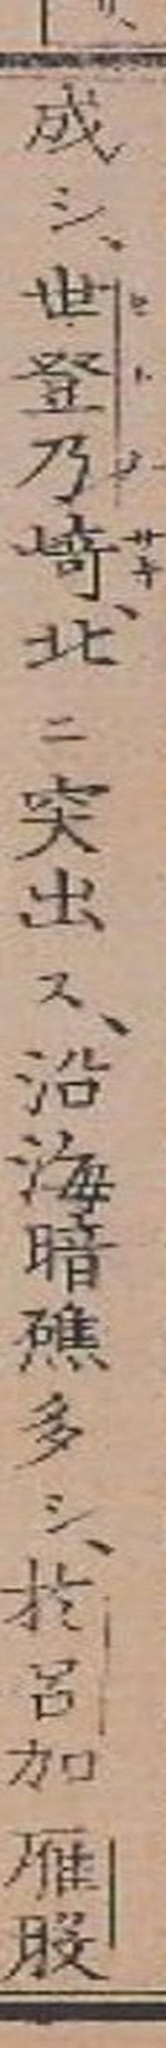成シ、世登乃崎、北ニ突出ス、沿海暗礁多シ、於呂加雁股
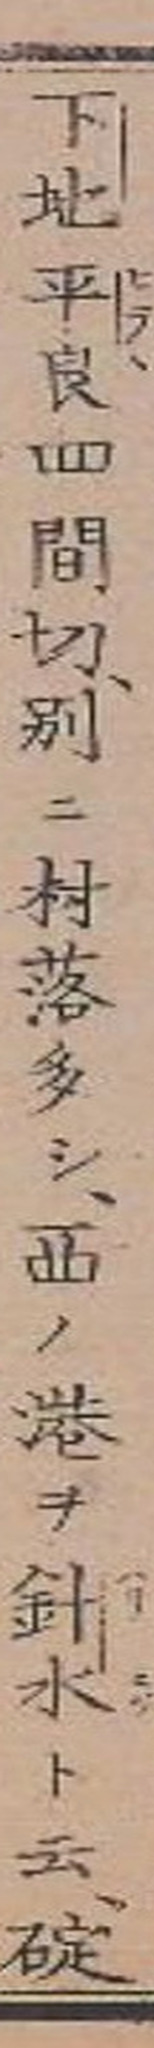下地平良四間切、別ニ村落多シ、西ノ港ヲ針水ト云、碇
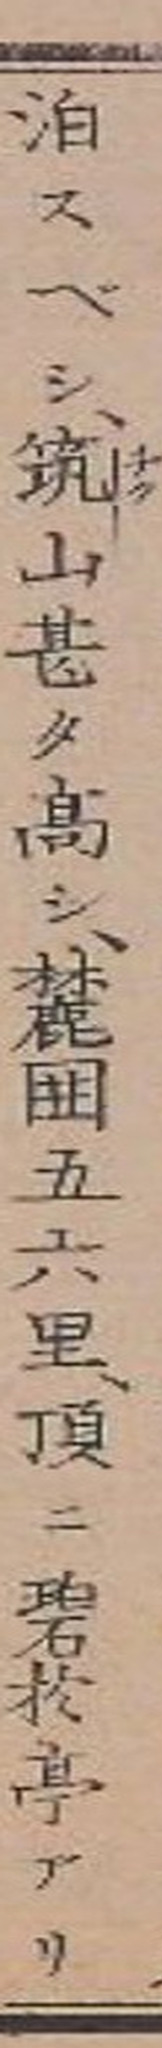泊スベシ、筑山甚タ高シ、麓囲五六里、頂ニ碧於亭アリ
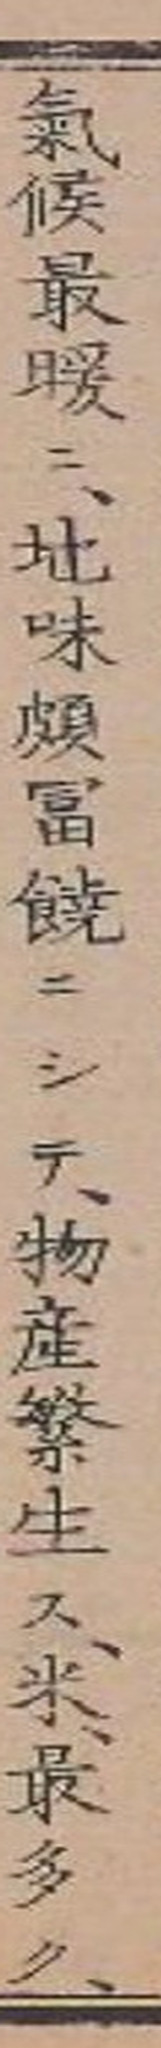気候最暖二、地味頗富饒ニシテ、物産繁生ス、米、最多ク、
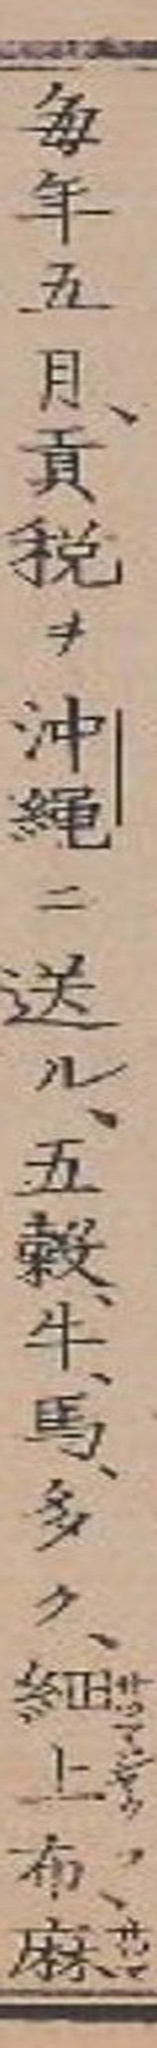毎年五月、貢税ヲ沖縄ニ送ル、五穀、牛、馬、多ク、細上布、麻
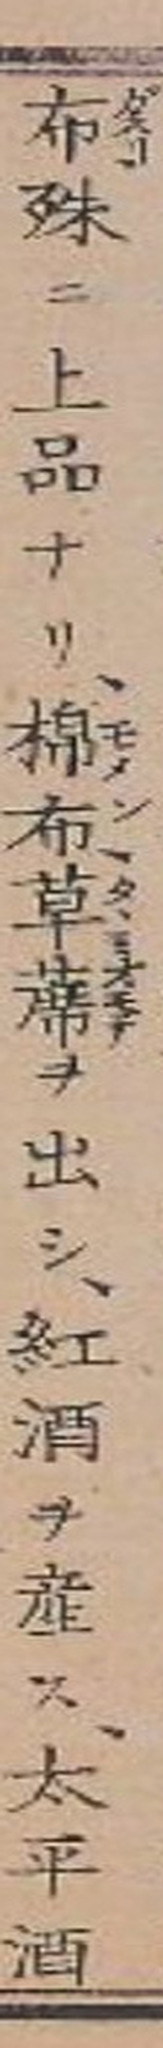布殊ニ上品ナリ、棉布、草蓆ヲ出シ、紅酒ヲ産ス、太平酒
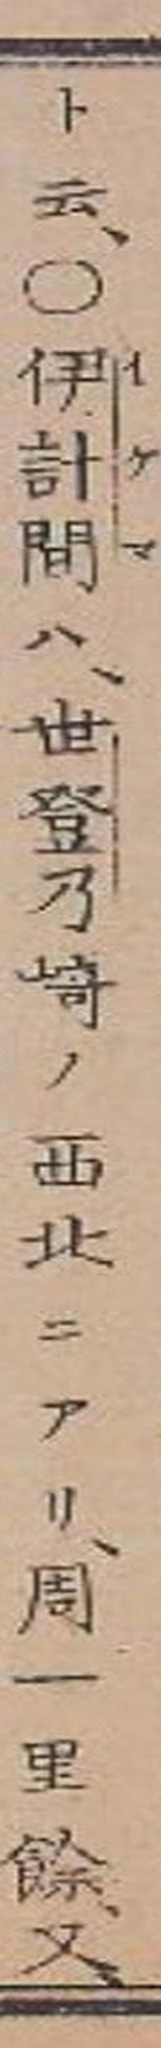ト云、○伊計間ハ、世登乃崎ノ西北ニアリ、周一里余、又、
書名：琉球新誌 巻上
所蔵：University of the Ryukyus Library
